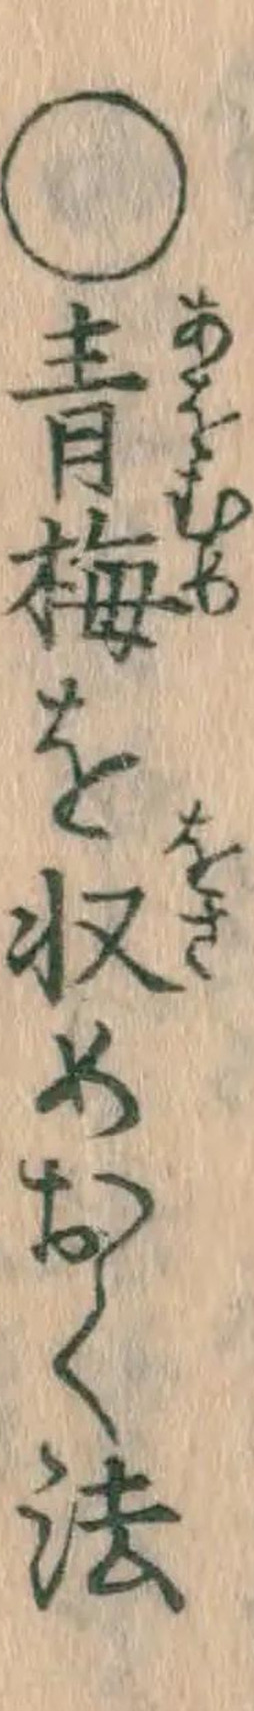○青梅を収めおく法
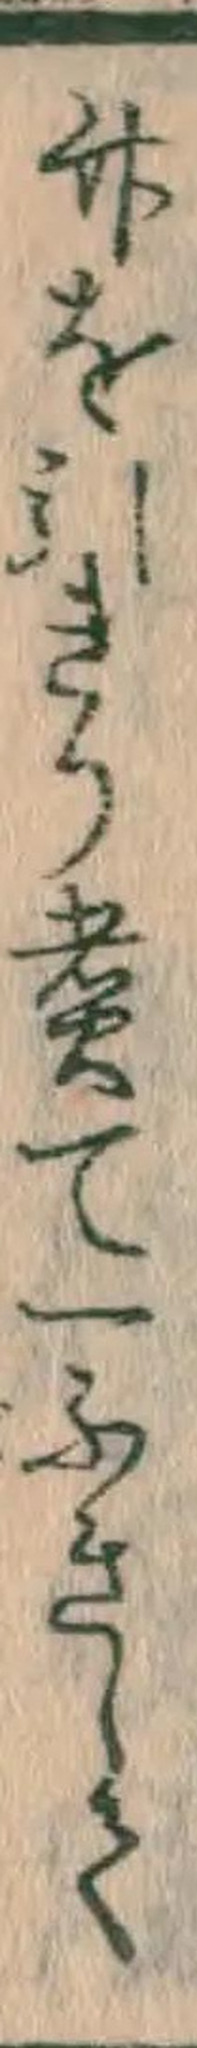竹を引きり煮て一ふきして
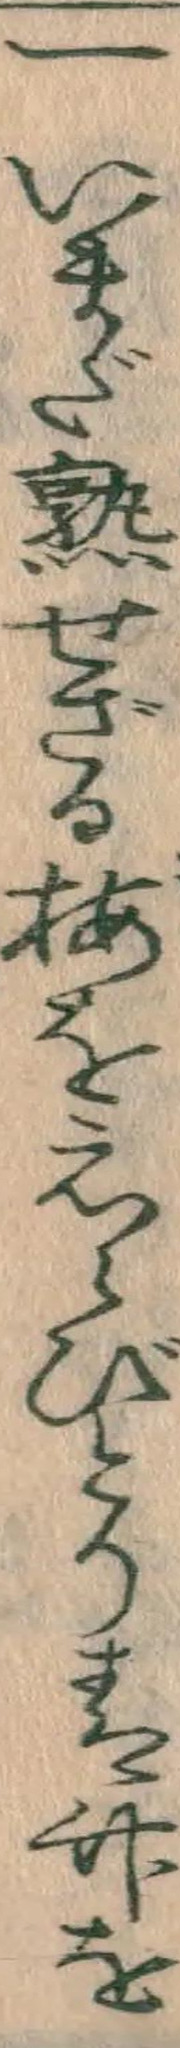一いまだ熟せざる梅をえらびとり青竹を
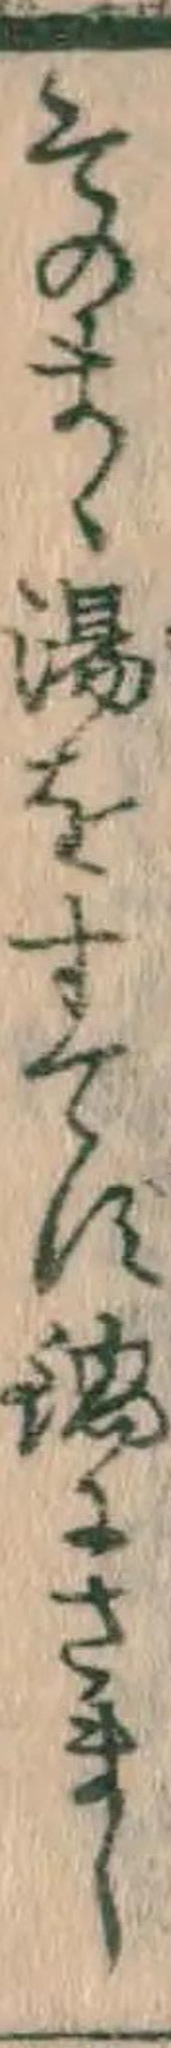そのまゝ湯をすてず鍋にさまし
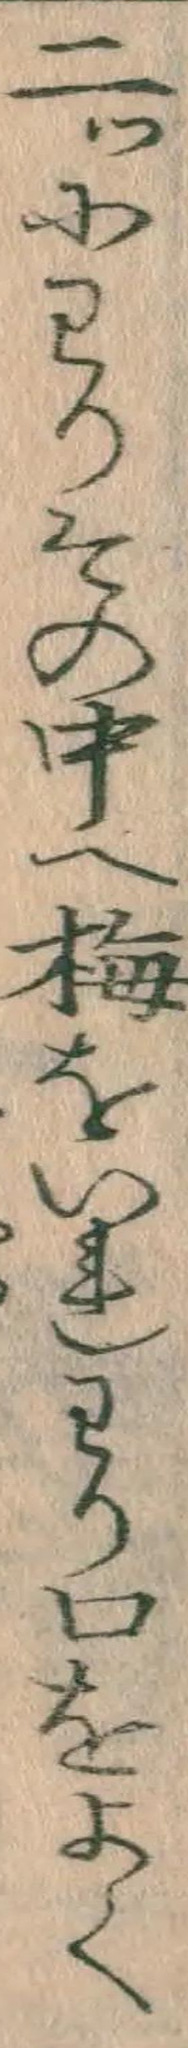二ッにわりその中へ梅をいれわり口をよく
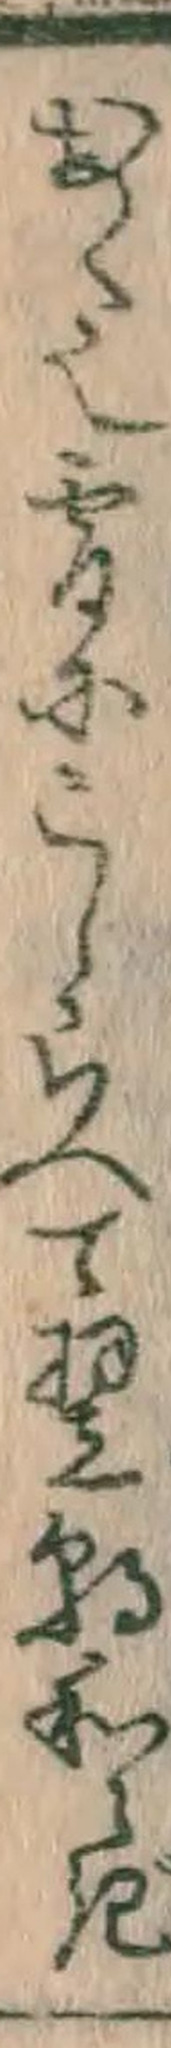おく也宵にこしらへて翌朝和らぎ
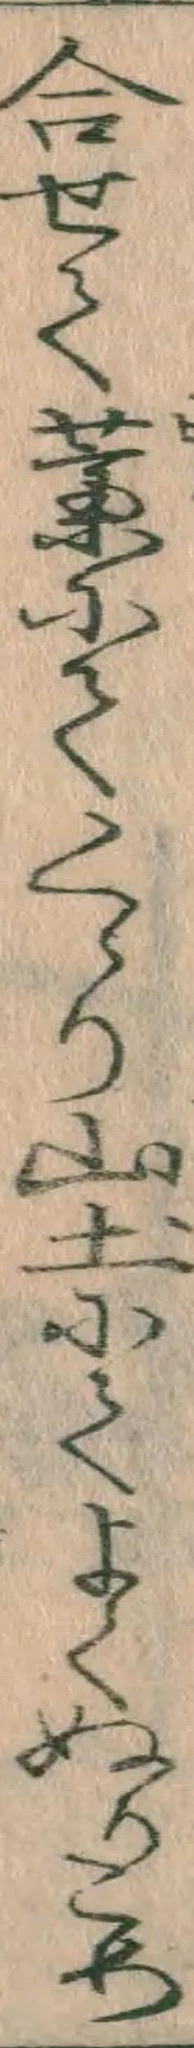合せて藁にてくゝり山土にてよくぬりこめ
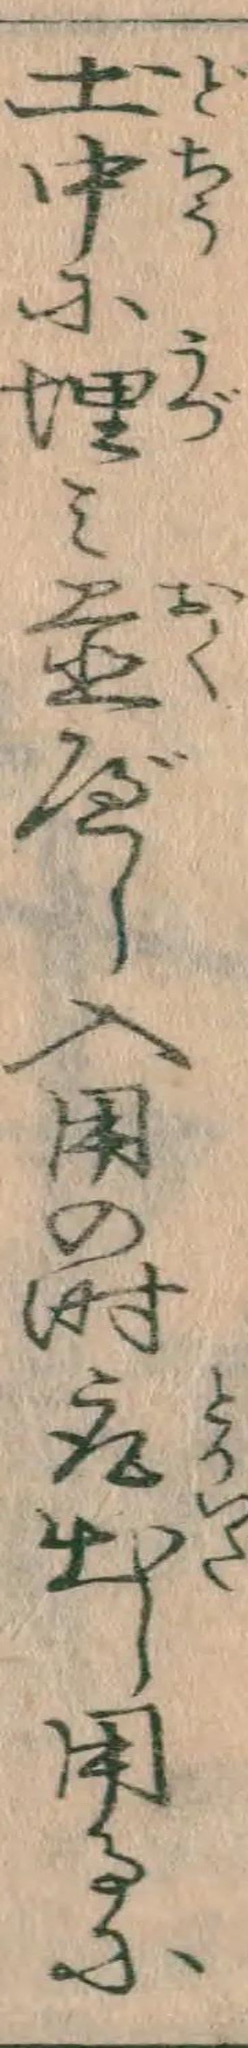土中に埋み置べし入用の時取出し用るに
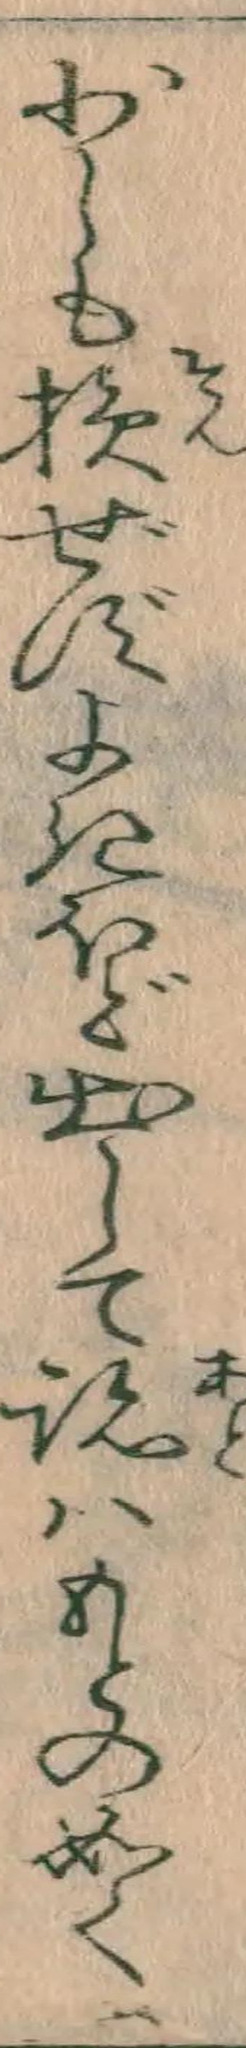少しも損ぜずよきほど出して跡はもとの如く
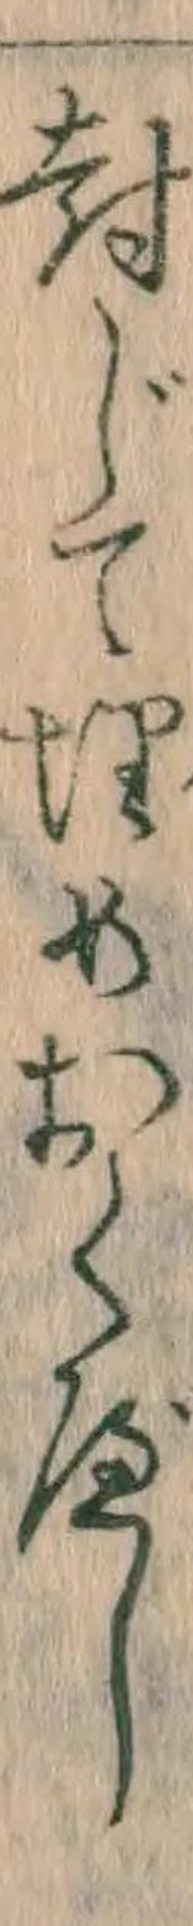封じて埋めおくべし
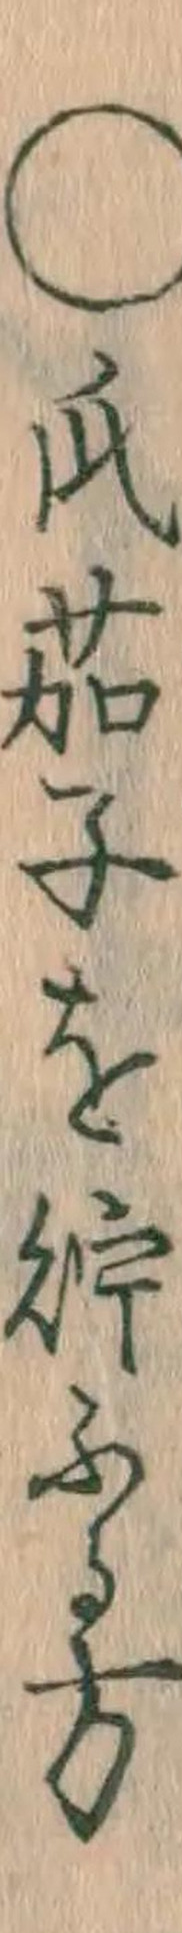○瓜茄子を貯ふる方
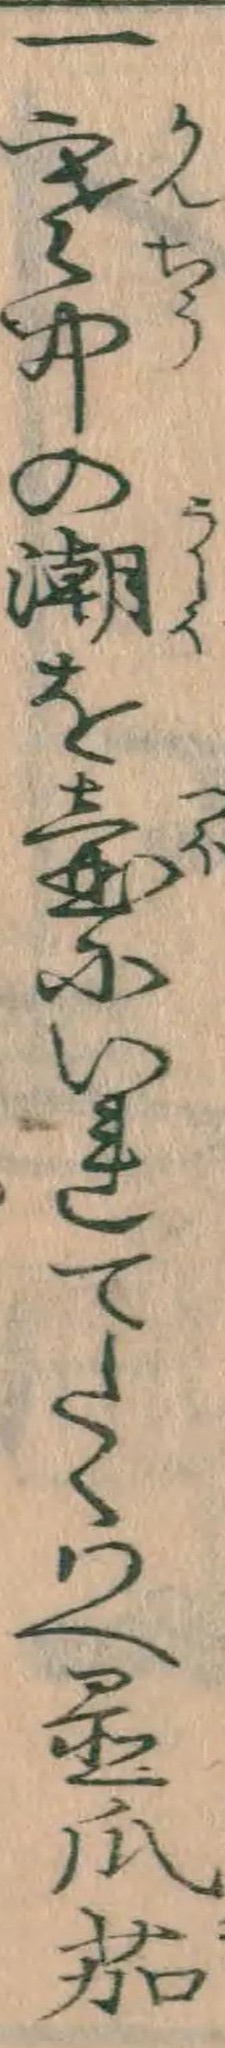一寒中の潮を壺にいれてたくはへ置瓜茄
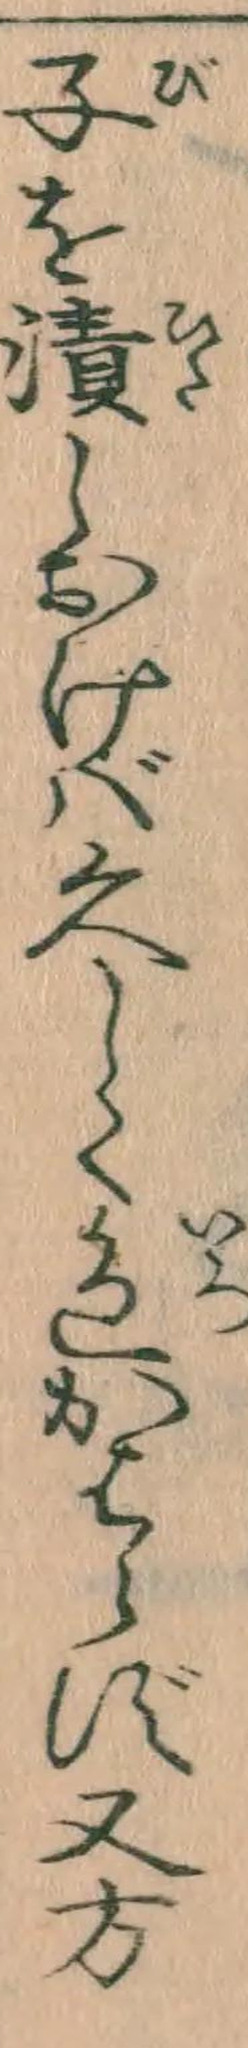子を漬しおけば久しく色かはらず又方
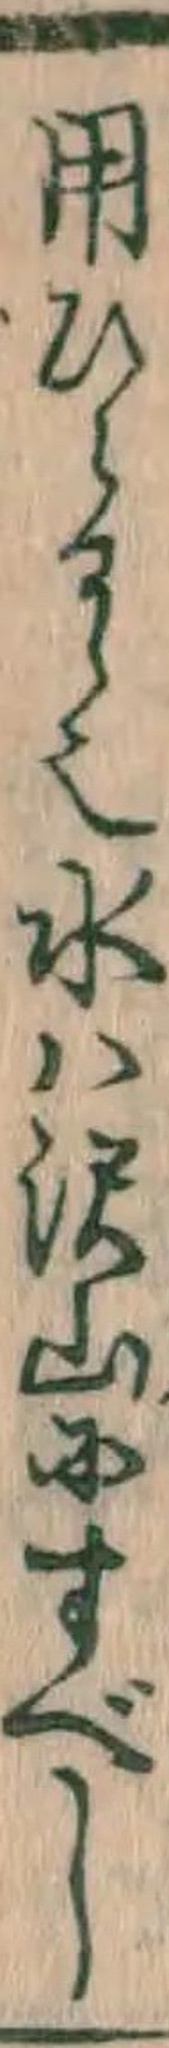用ひらく也水は沢山にすべし
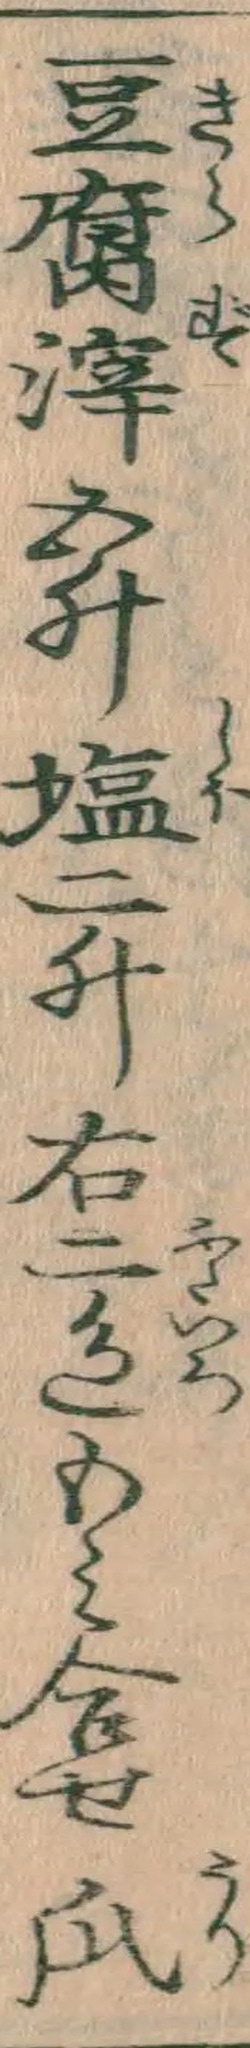豆腐滓五升塩二升右二色もみ合せ瓜
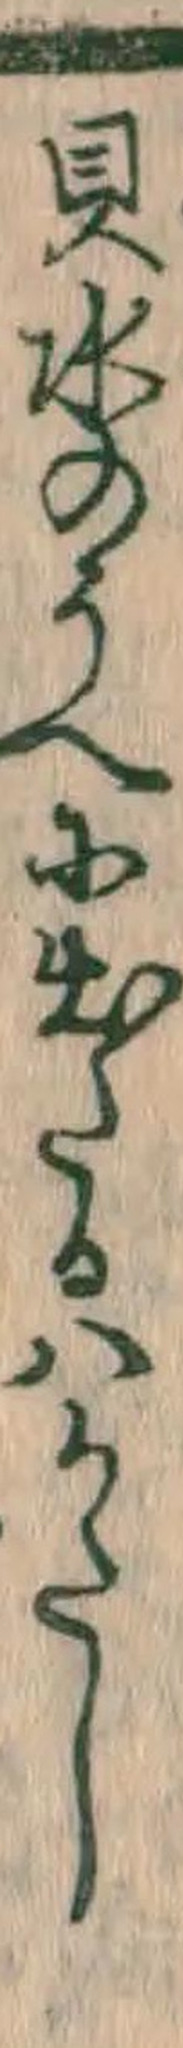貝水のうへに出たるはかたし
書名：広益秘事大全 3巻. [5]
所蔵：国立国会図書館 National Diet Library, JAPAN
